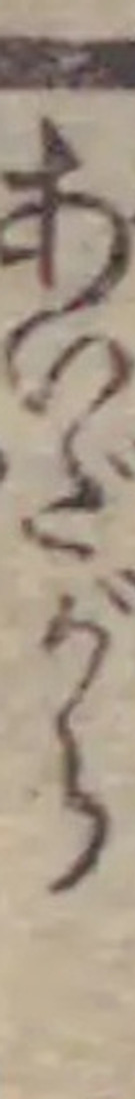あいだがら
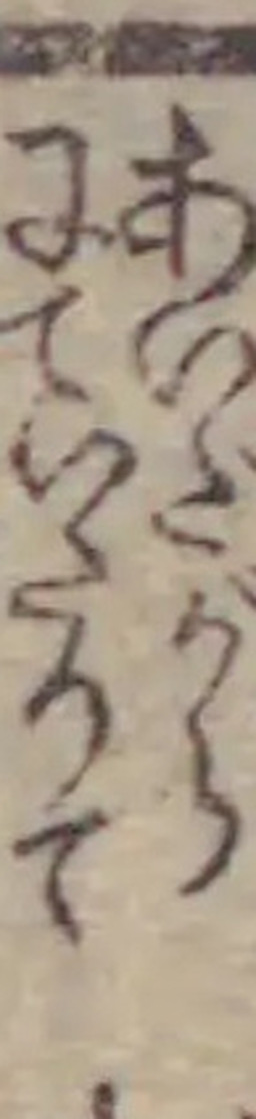にていたつて
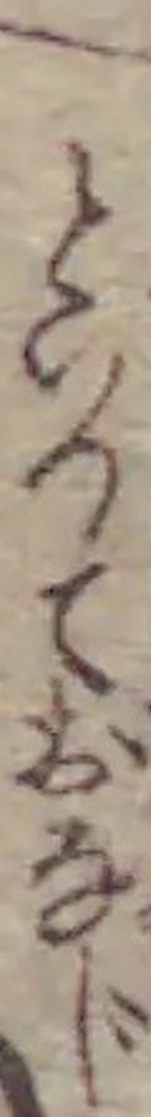といつておなじ
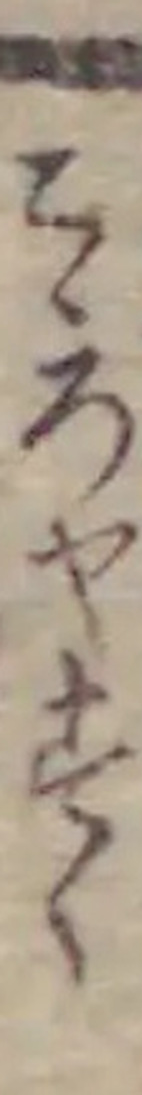こゝろやすく
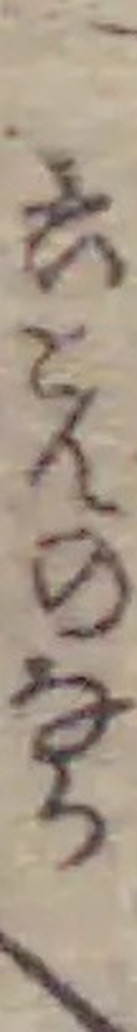六こんのなか
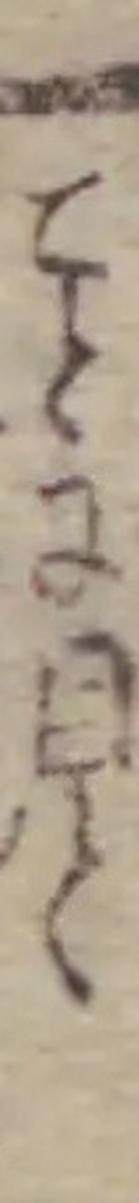ことに目と
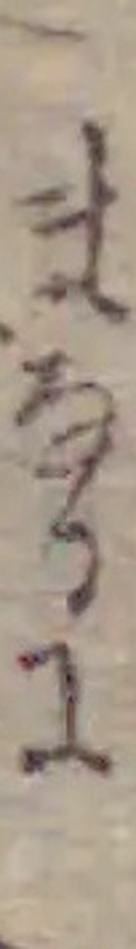まなるに
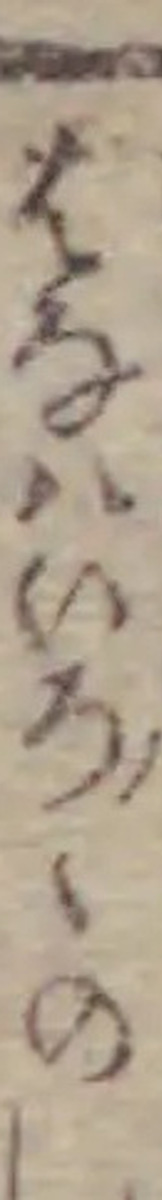はなはいろ〳〵の
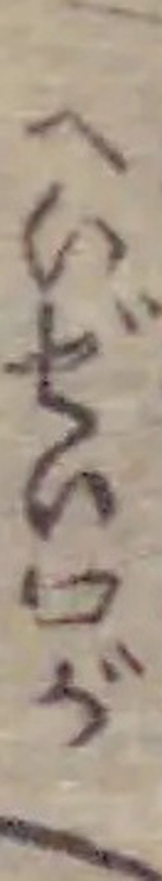へいぜい口が
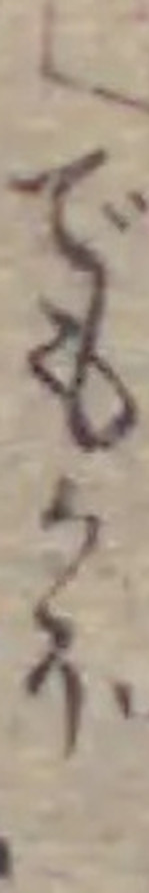でもかほ
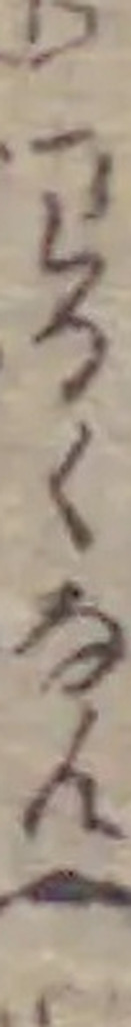わるくなん
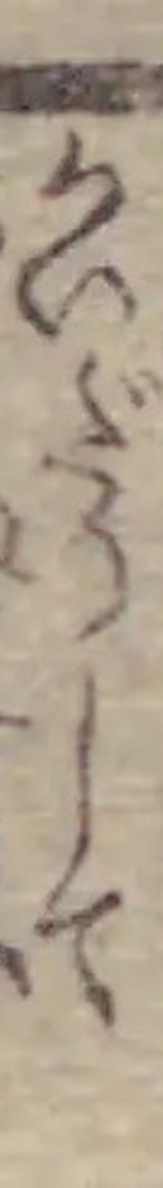かいだりして
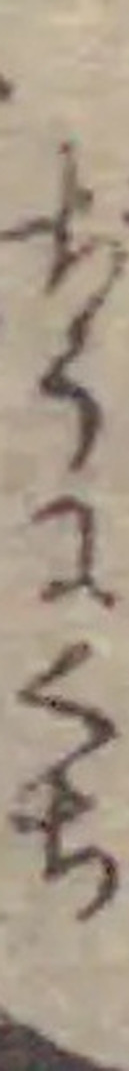ぢうにくち
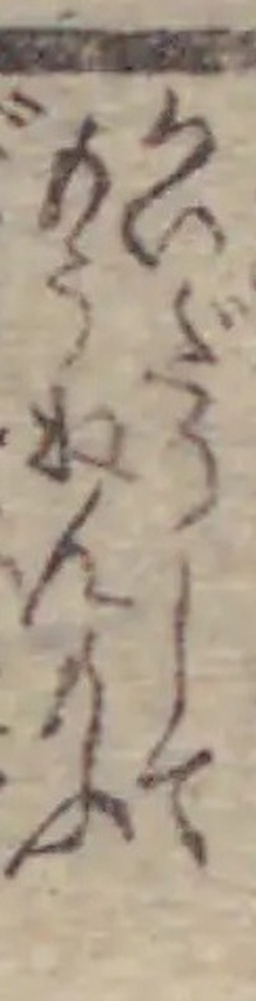もうねんもふ
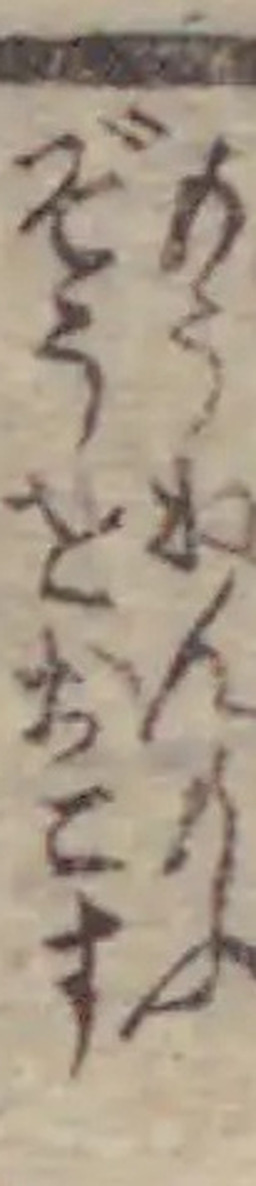ぞうをおこす
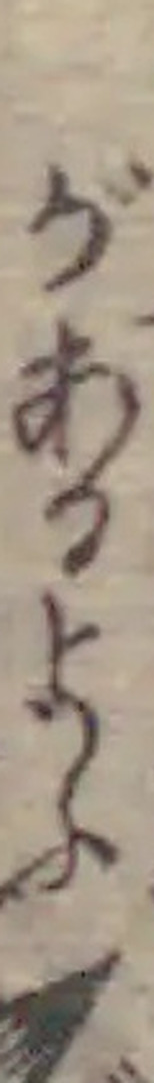があるよふ
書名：腹内養生主論 3巻
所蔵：国立国会図書館 National Diet Library, JAPAN
